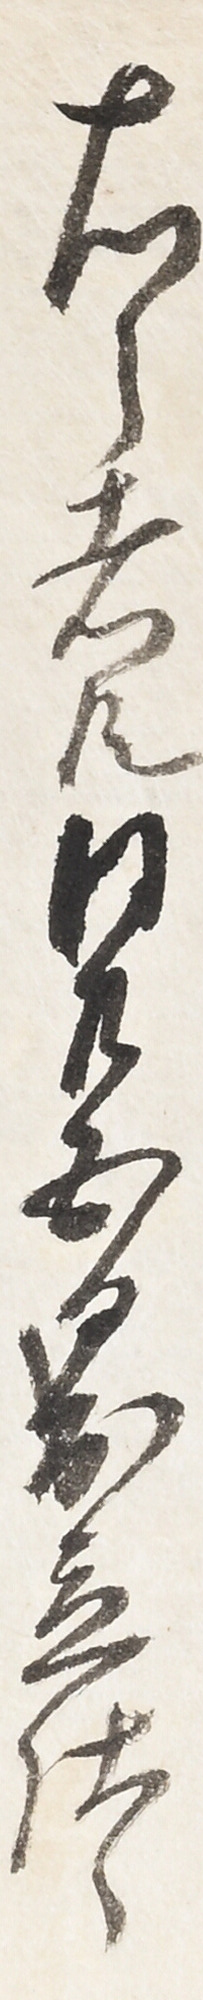右之者共同廿五日出立仕候
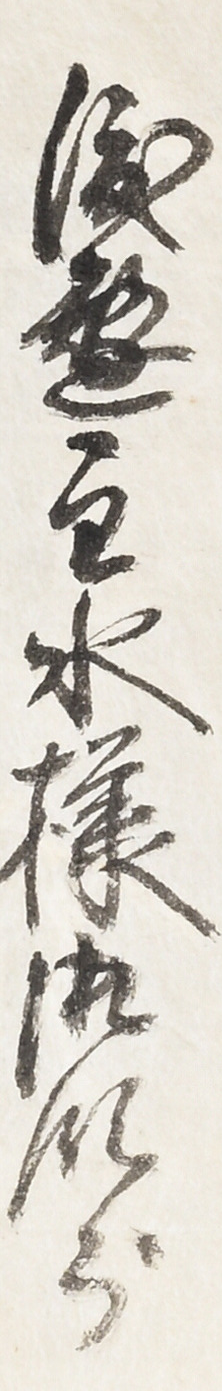渡辺主水様御領分
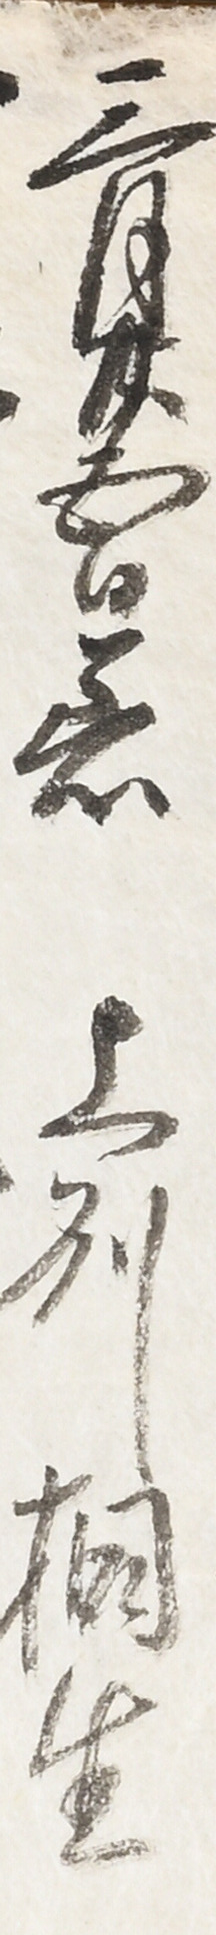三月廿五日着上州桐生
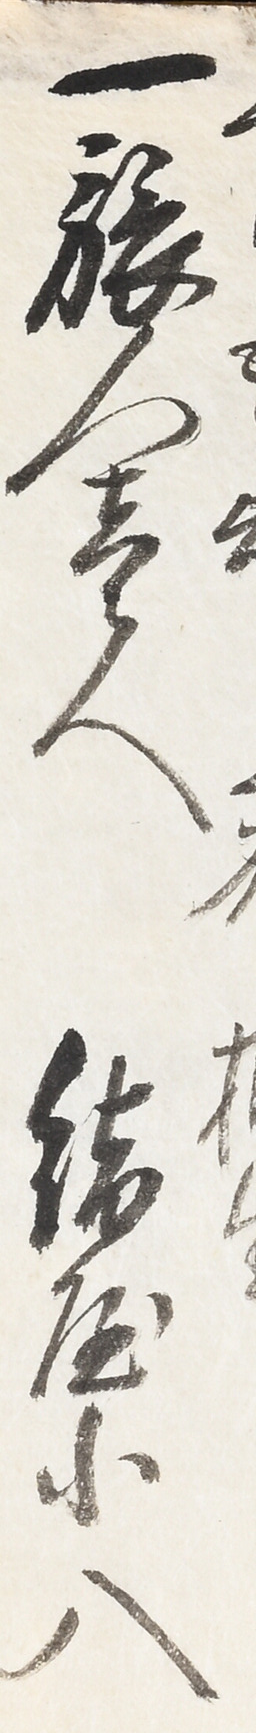一旅人壱人絹屋小八
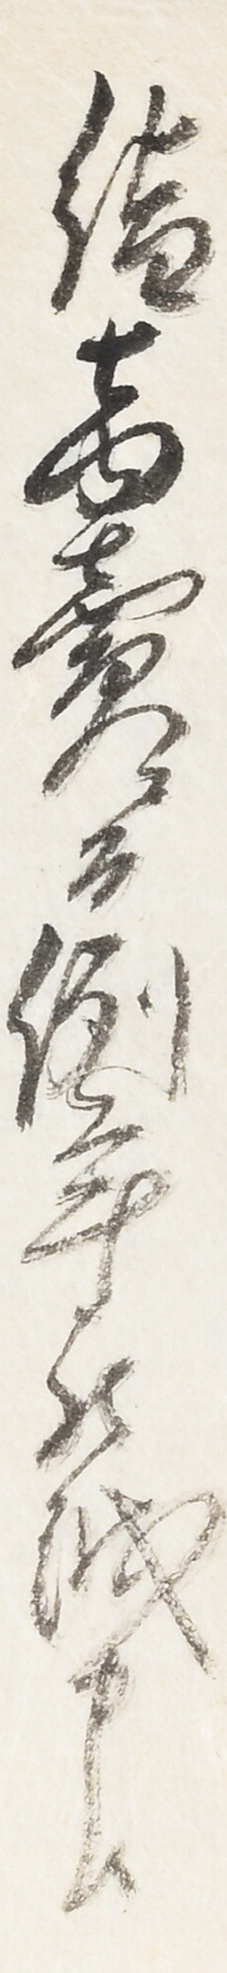絹商売ニ而例年罷越申候
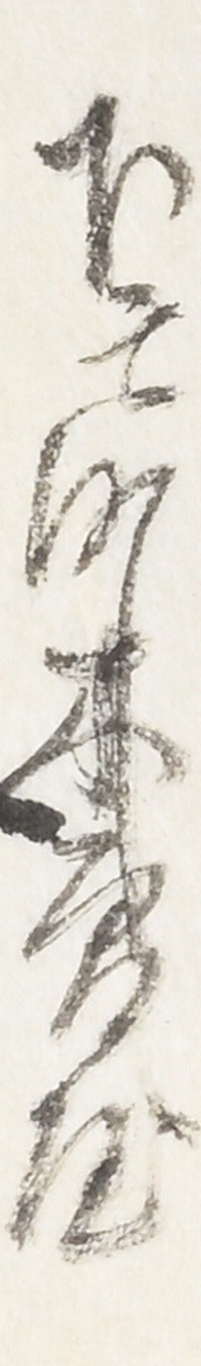下モ町木曽屋
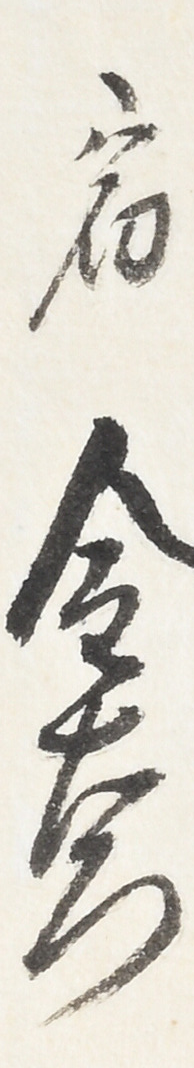宿金右衛門
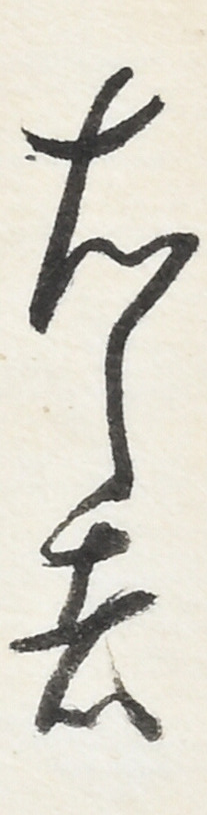右之者
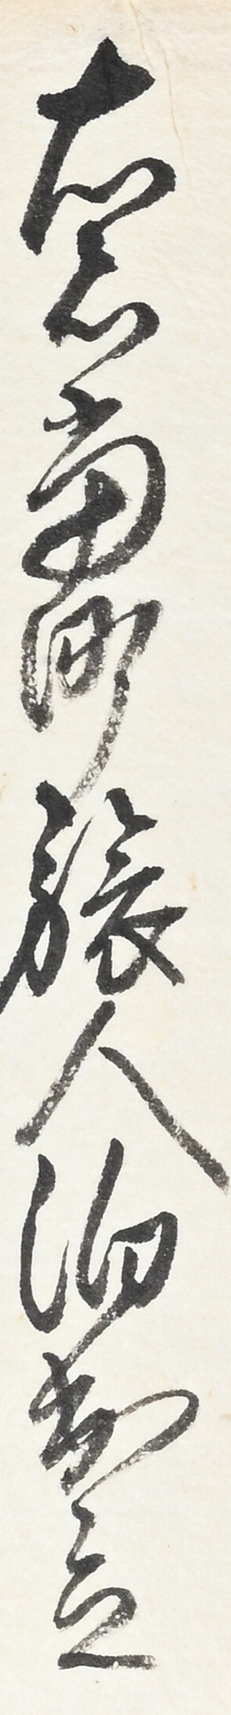右者当町旅人泊出立
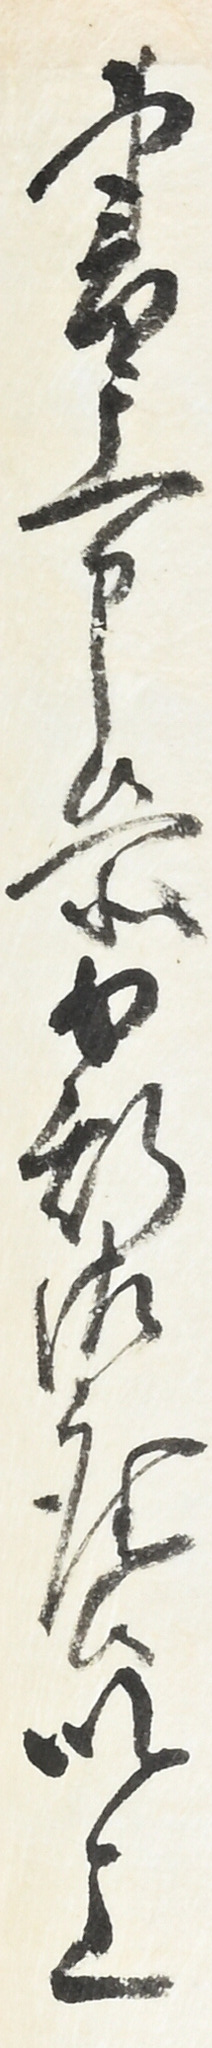書上申候所如斯御座候以上

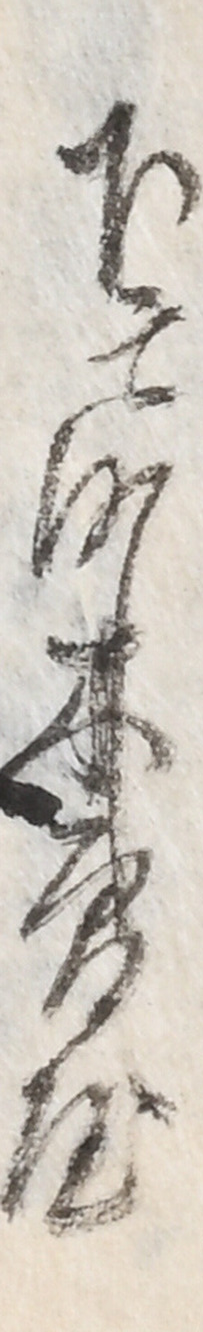下モ町木曽屋
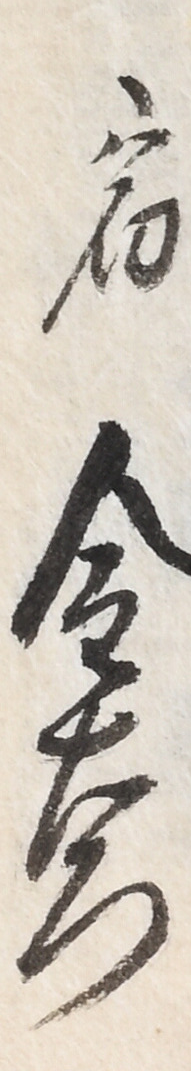宿金右衛門
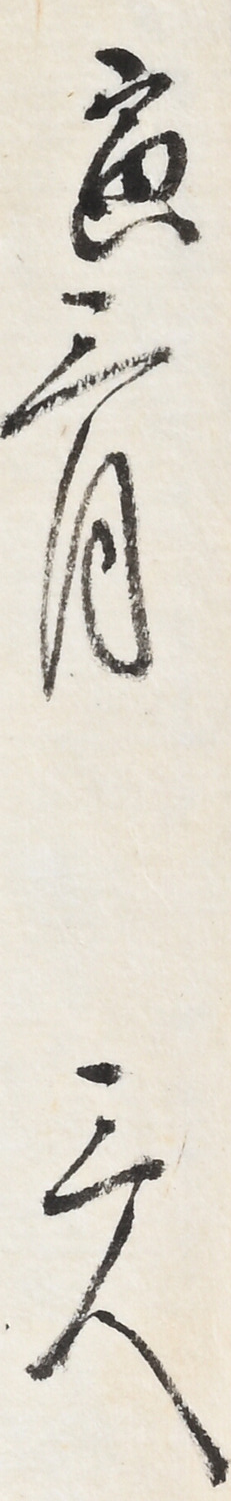寅三月三人
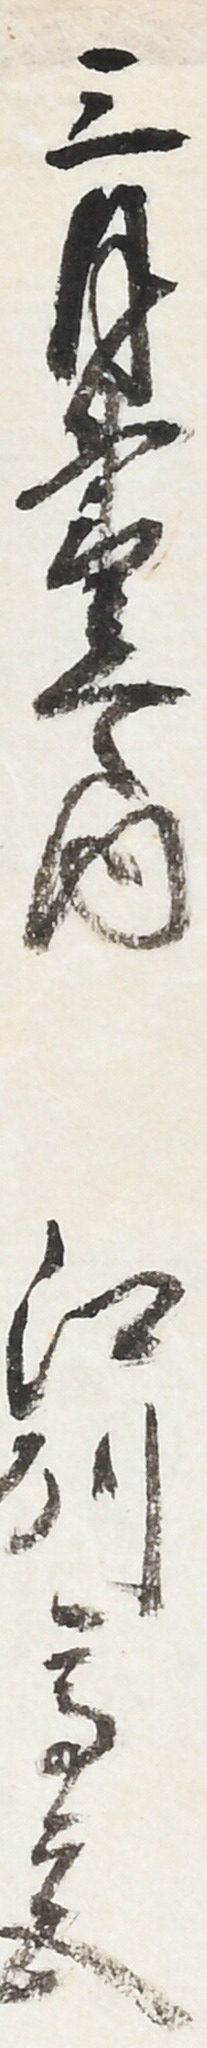三月書上之内江州高宮
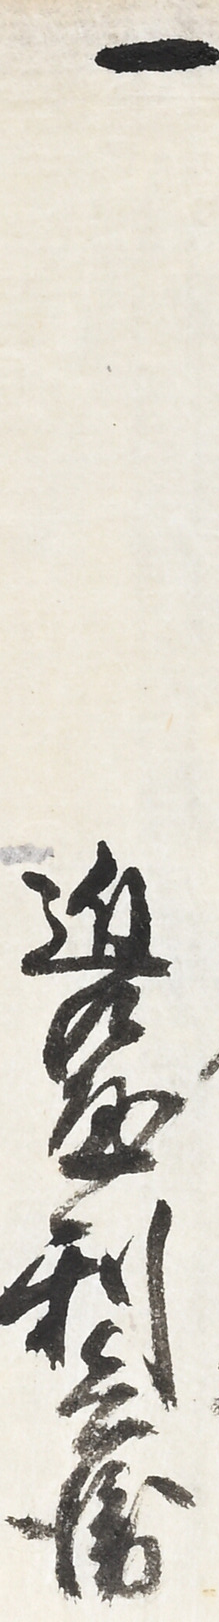一近江屋利兵衛
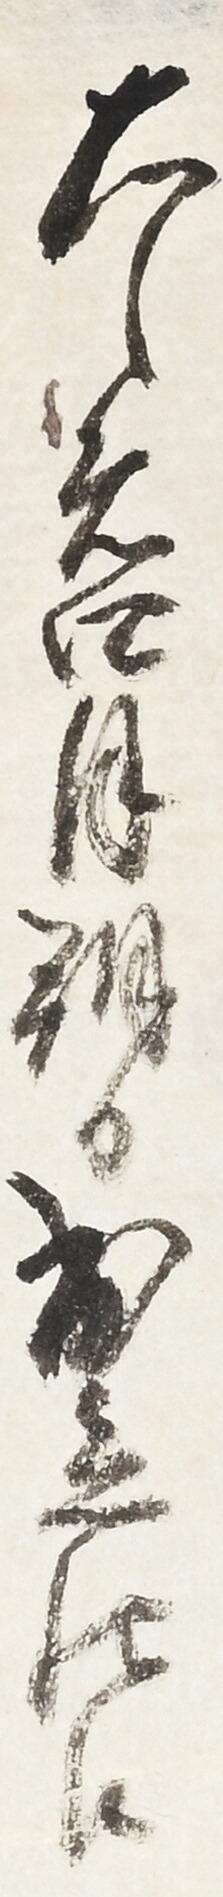右之者四月朔日出立仕候
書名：旅人泊控帳
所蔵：伊那市立高遠町図書館・合同会社AMANE
